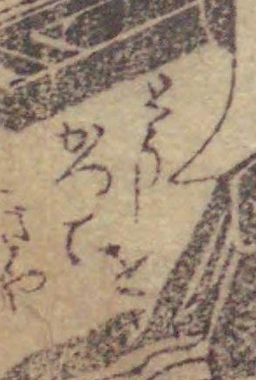かつて
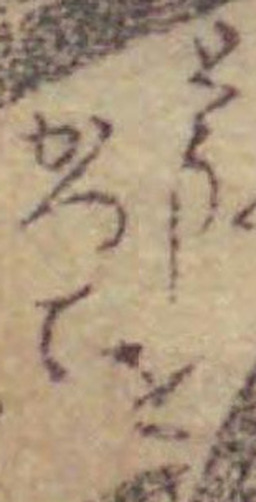かつて

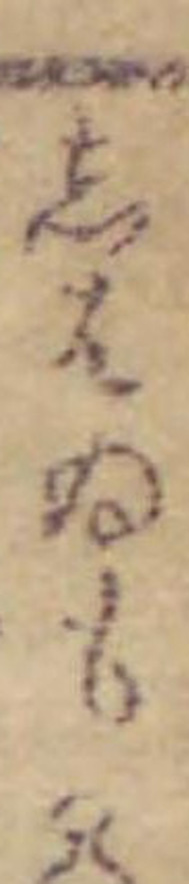しはゐも
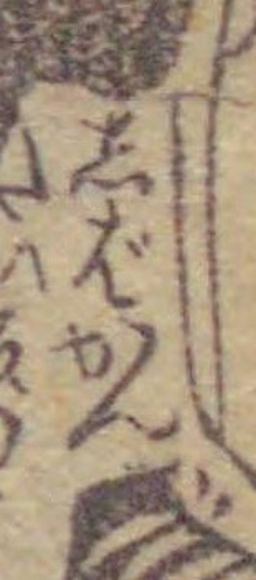しばかん
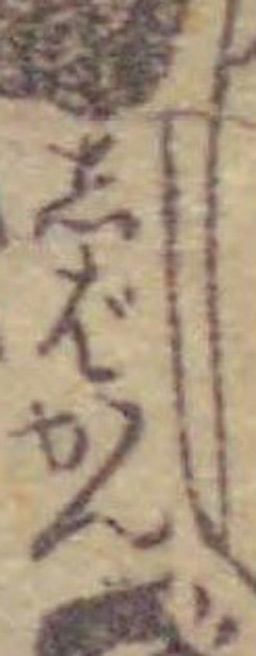しばかん
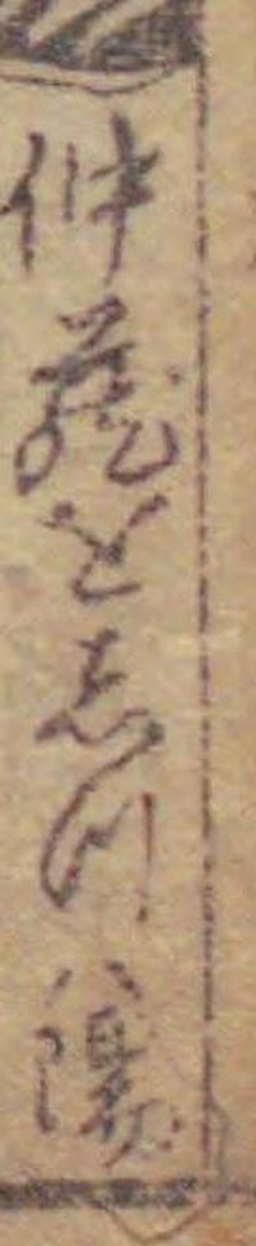仲蔵をしつは陽
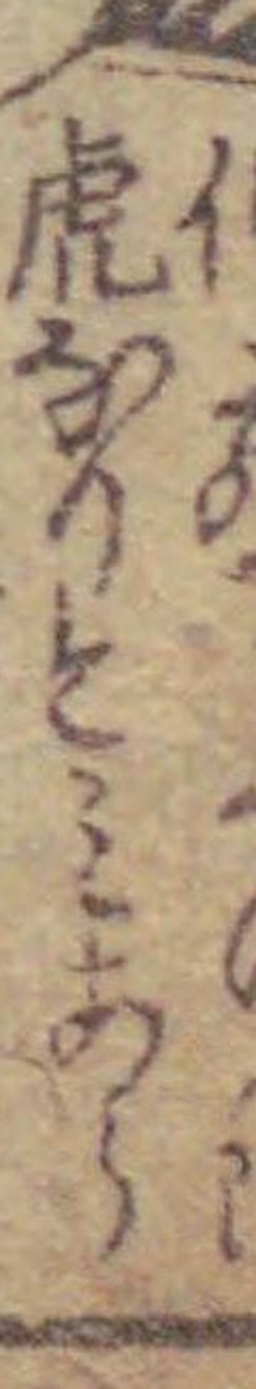虎なりとみあら
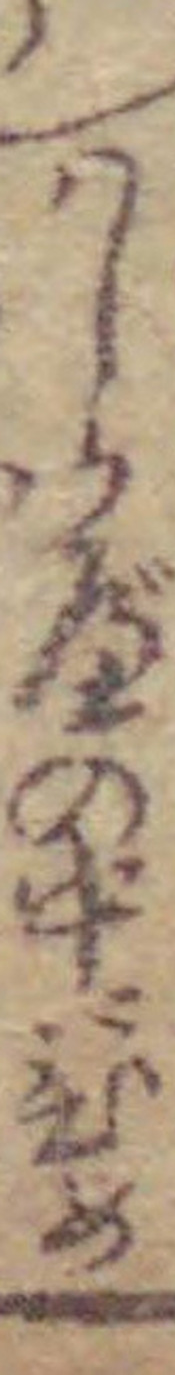はしかべの中にひめ
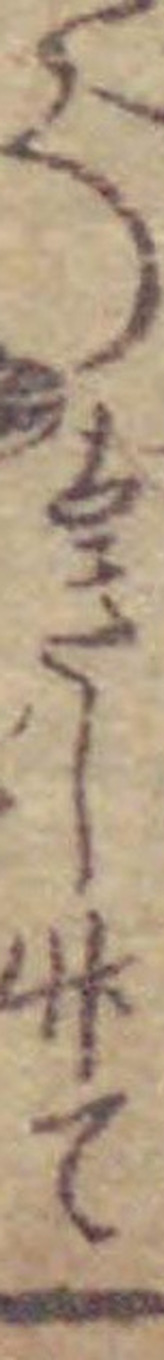おきし竹て
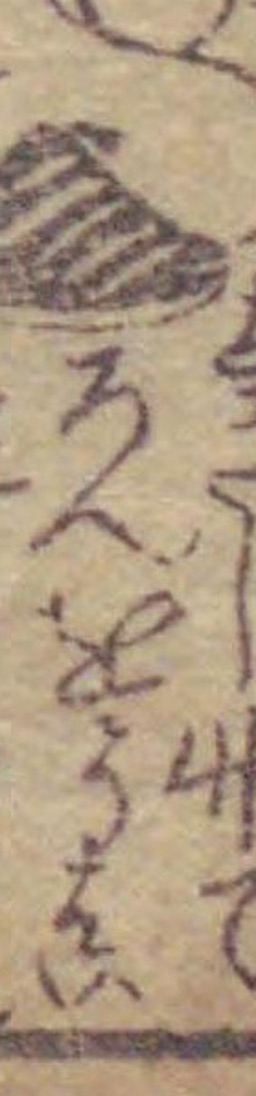ろんをうはい
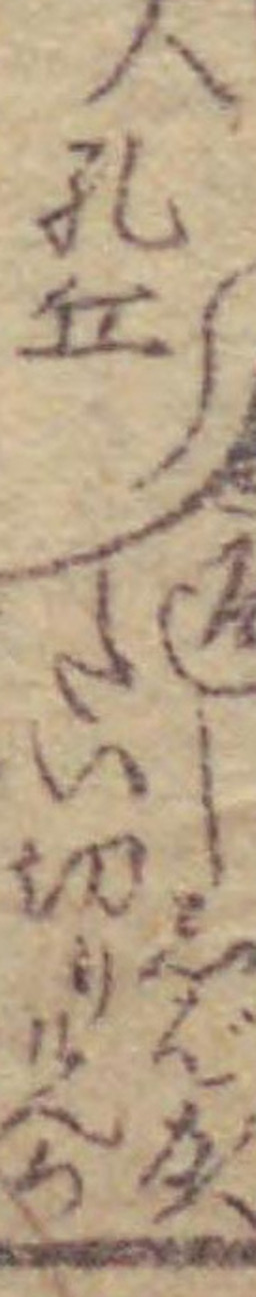たい切りけんか
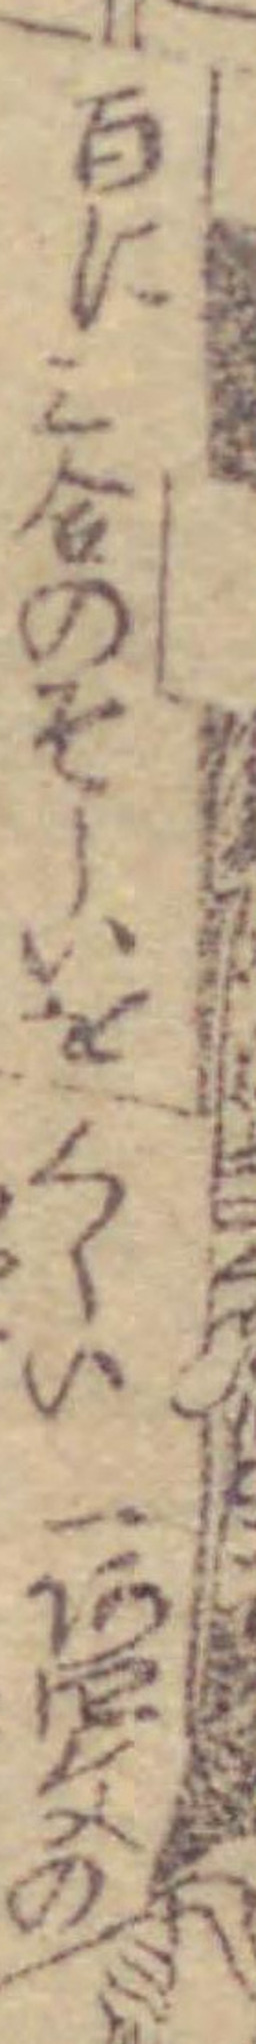百に三合のそしいをくらい一阿？四文の
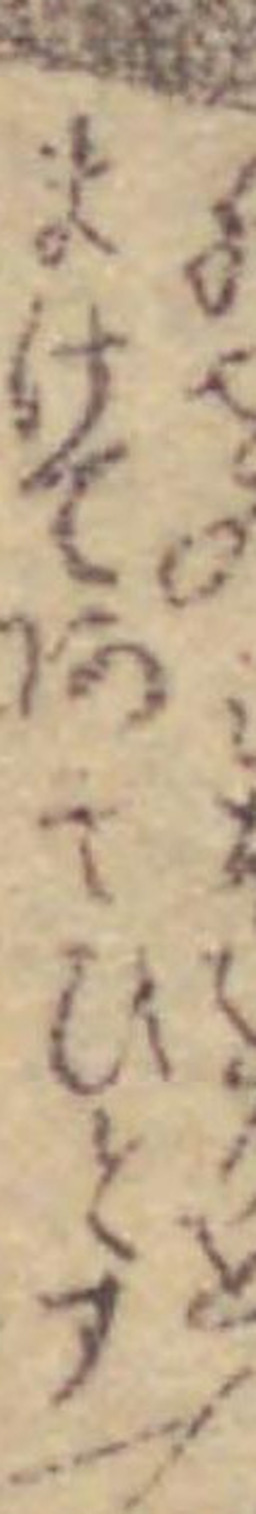まけてあてひとす
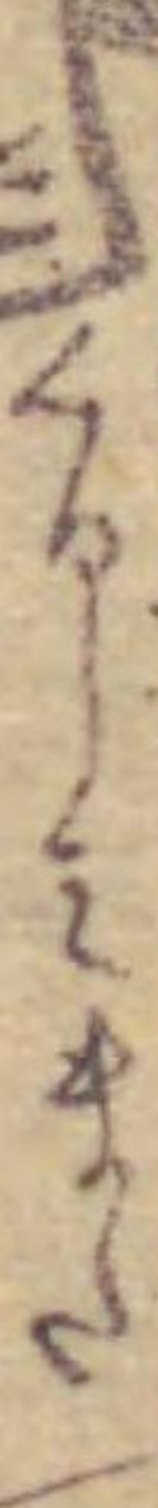くるしみまた
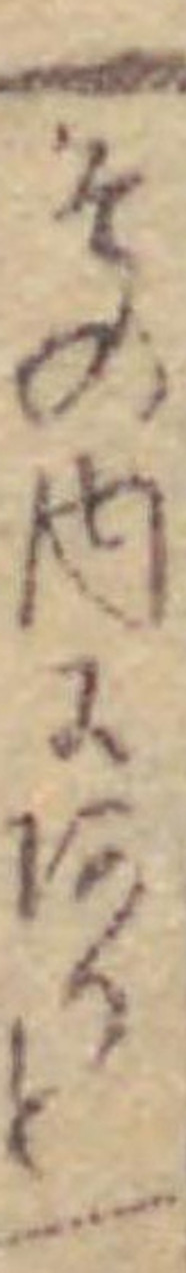その内にありと
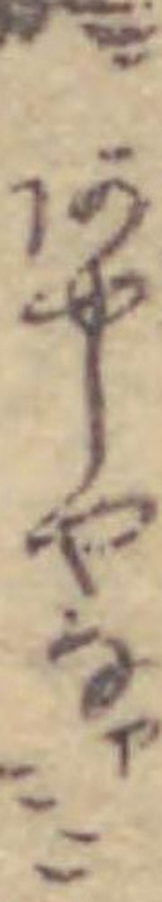あやしやなァ
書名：天下一面鏡梅鉢 : 3巻
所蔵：国立国会図書館 National Diet Library, JAPAN
